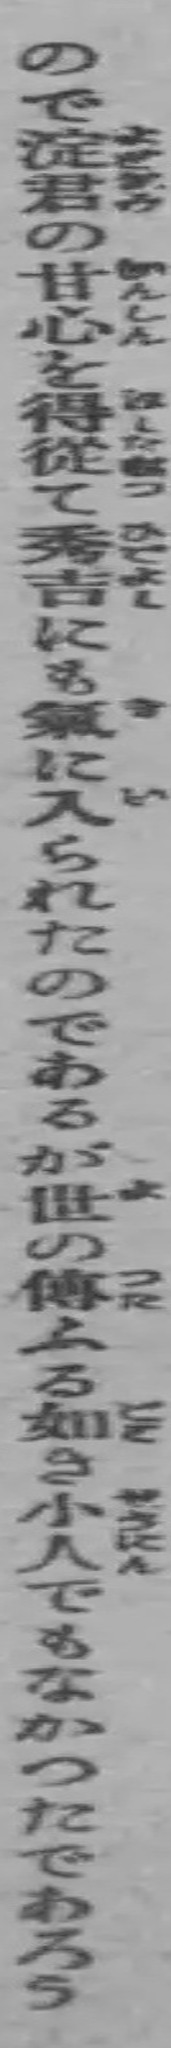ので淀君の甘心を得従て秀吉にも気に入られたのであるが世の伝ふる如き小人でもなかつたであろう
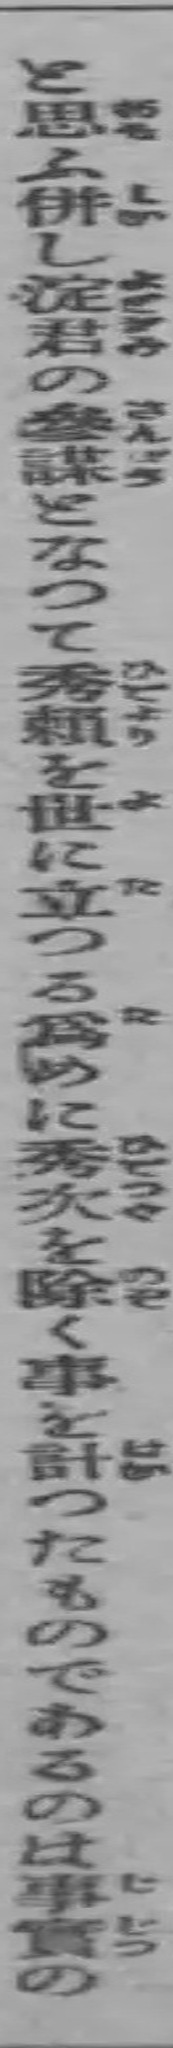と思ふ併し淀君の参謀となつて秀頼を世に立つる為めに秀次を除く事を計つたものであるのは事実の
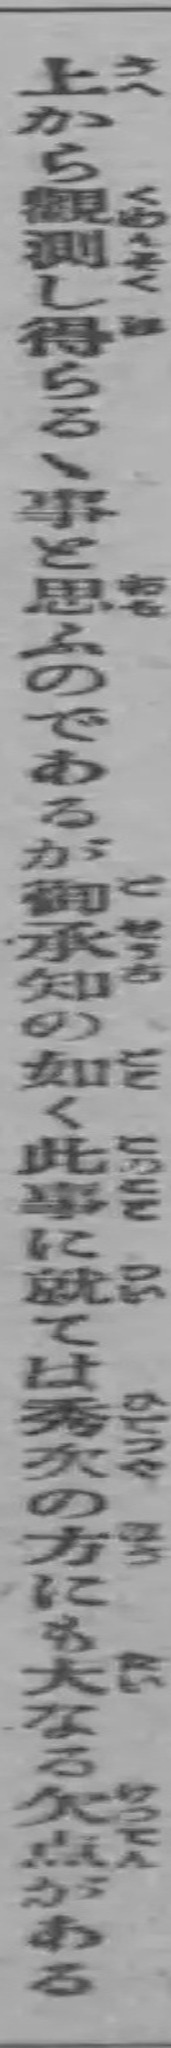上から観測し得らるゝ事と思ふのであるが御承知の如く此事に就ては秀次の方にも大なる欠点がある
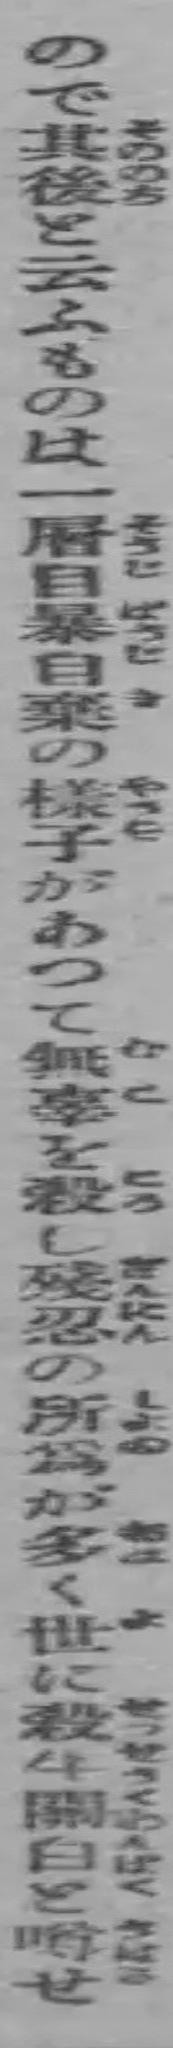ので其後と云ふものは一層自暴自棄の様子があつて無辜を殺し残忍の所為が多く世に殺生関白と噂せ
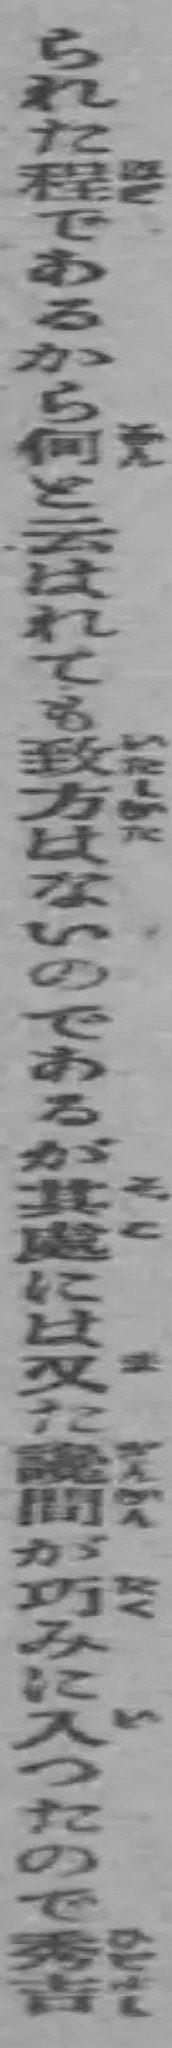られた程であるから何と云はれても致方はないのであるが其処には又た讒間が巧みに入つたので秀吉

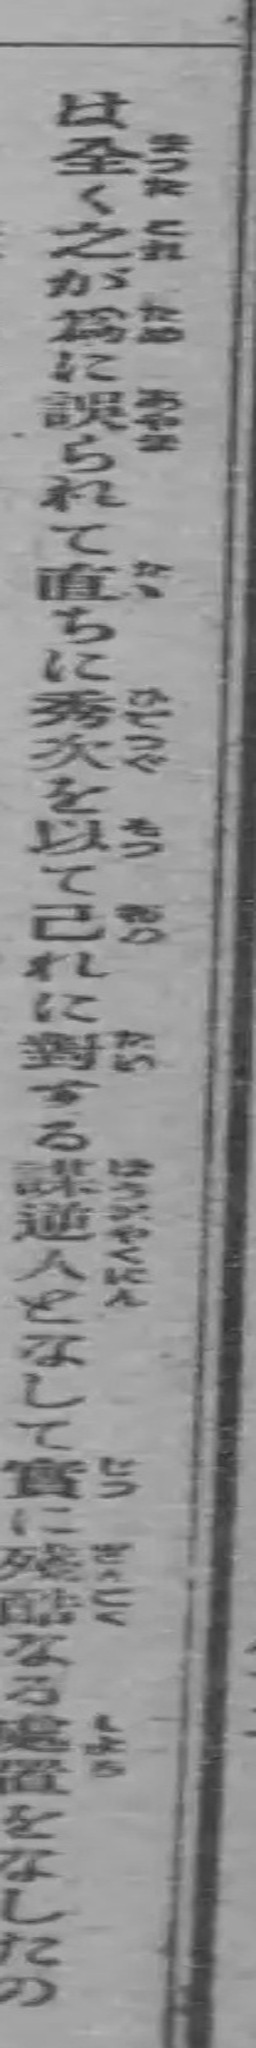秀次亡ぶは全く之が為に誤られて直ちに秀次を以て己れに対する謀逆人となして実に残酷なる処置をなしたの
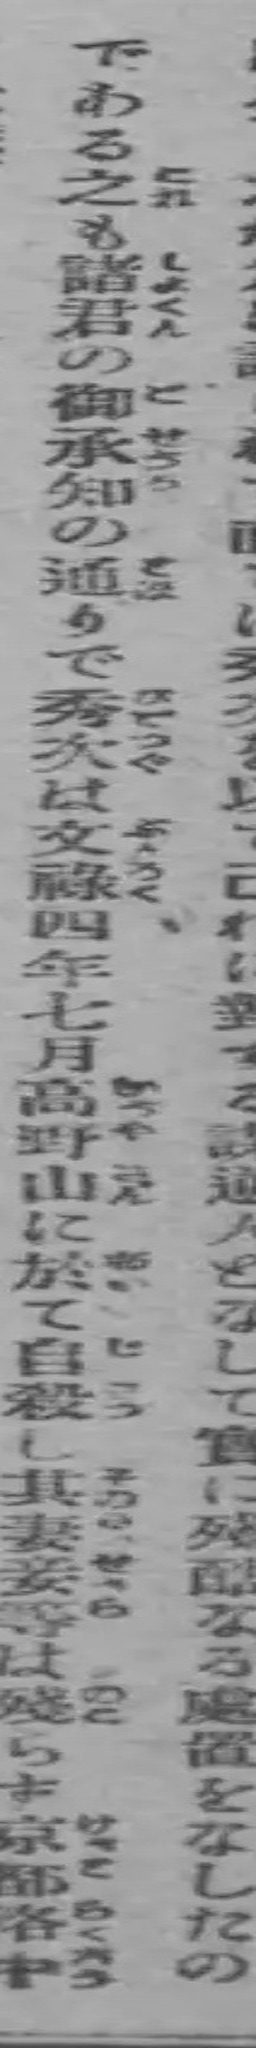である之も諸君の御承知の通りで秀次は文禄四年七月高野山に於て自殺し其妻妾等は残らず京都洛中
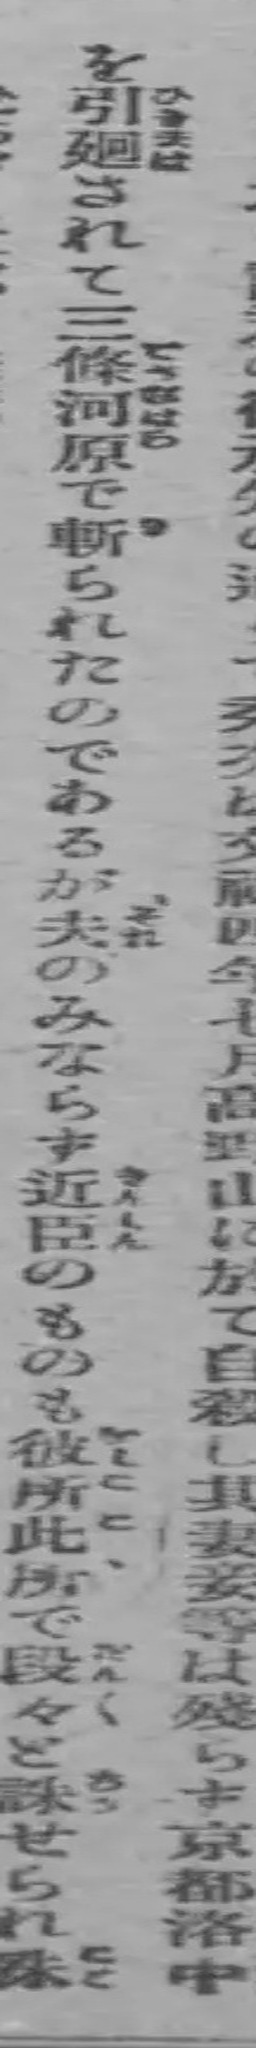を引廻されて三条河原で斬られたのであるが夫のみならず近臣のものも彼所此所で段々と誅せられ殊
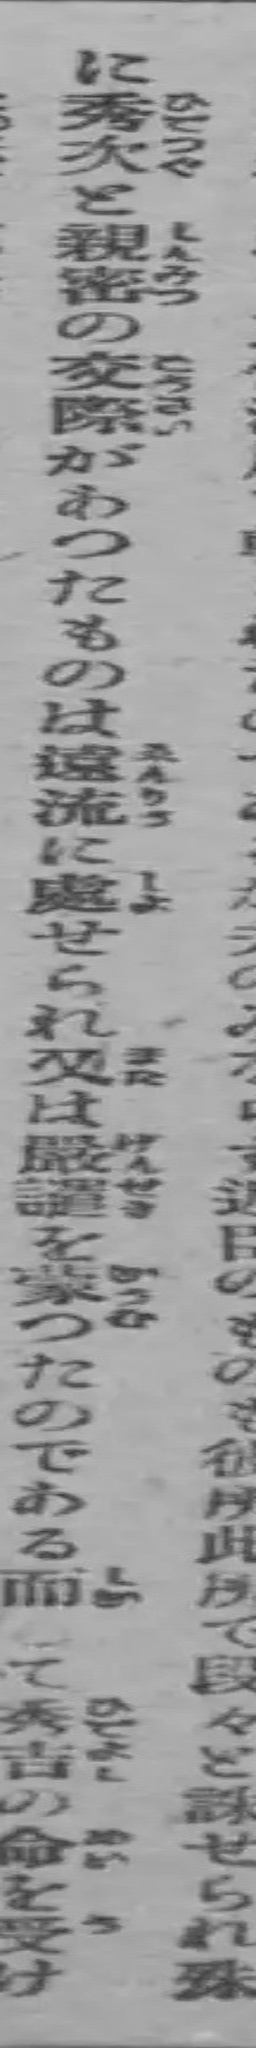に秀次と親密の交際があつたものは遠流に処せられ又は厳譴を蒙つたのである而して秀吉の命を受け
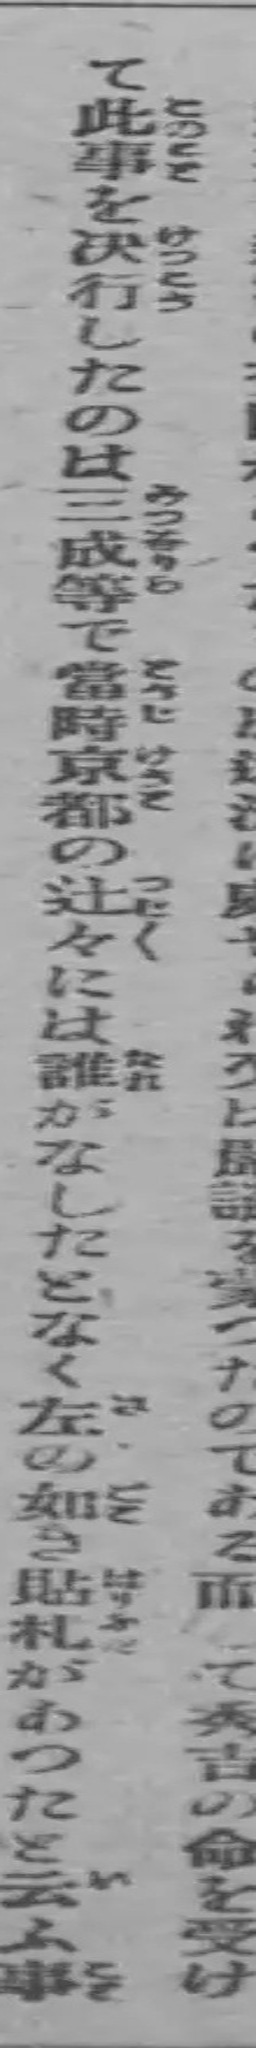て此事を決行したのは三成等で当時京都の辻々には誰がなしたとなく左の如き貼札があつたと云ふ事
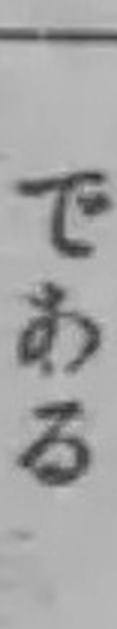である
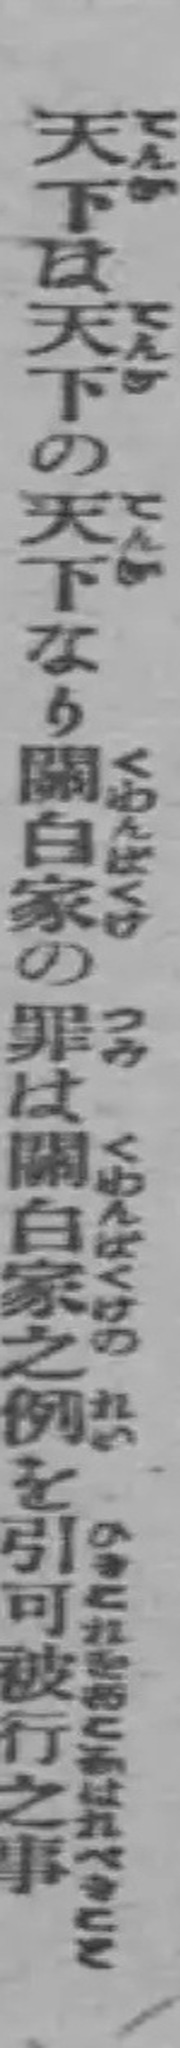天下は天下の天下なり関白家の罪は関白家之例を引可被行之事
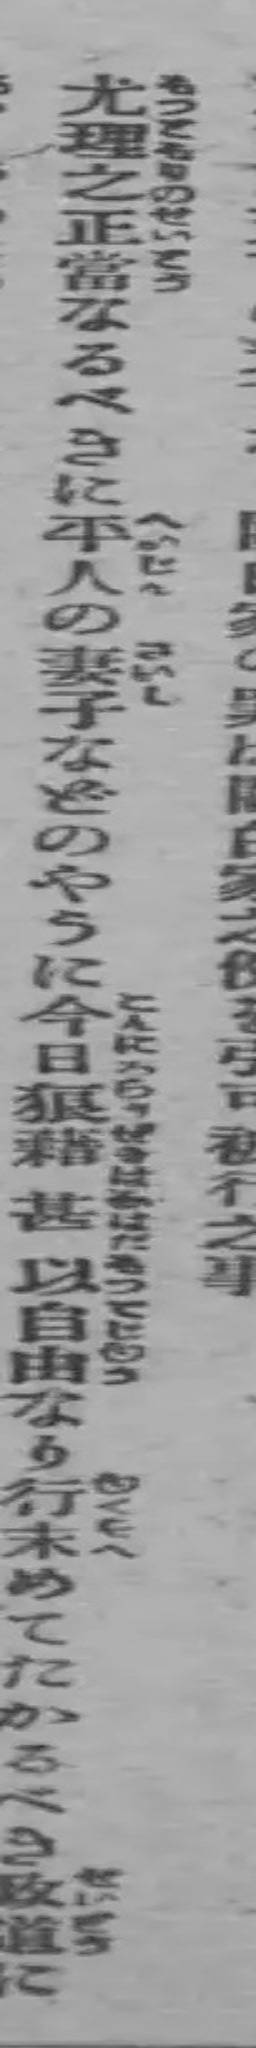尤理之正当なるべきに平人の妻子などのやうに今日狼藉甚以自由なり行末めてたかるべき政道に
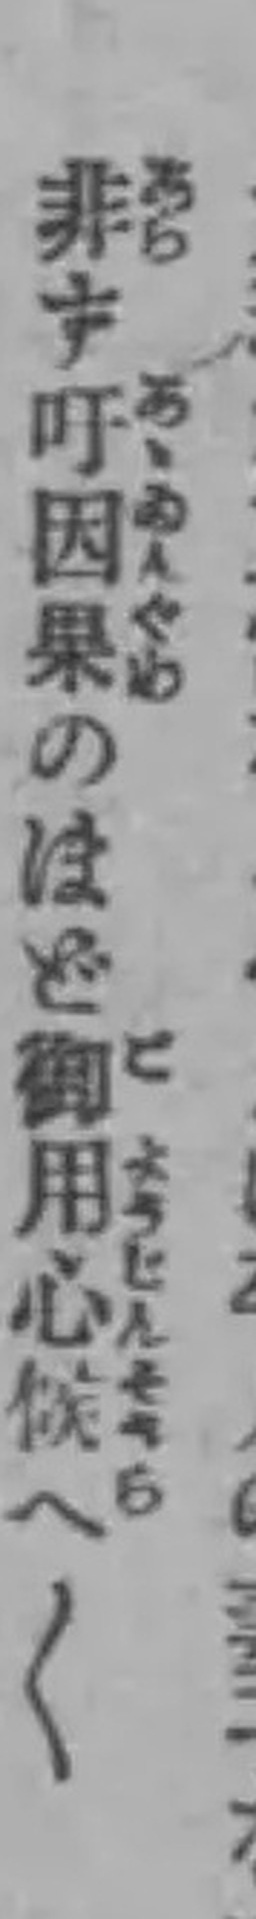非ず吁因果のほど御用心候へ〳〵
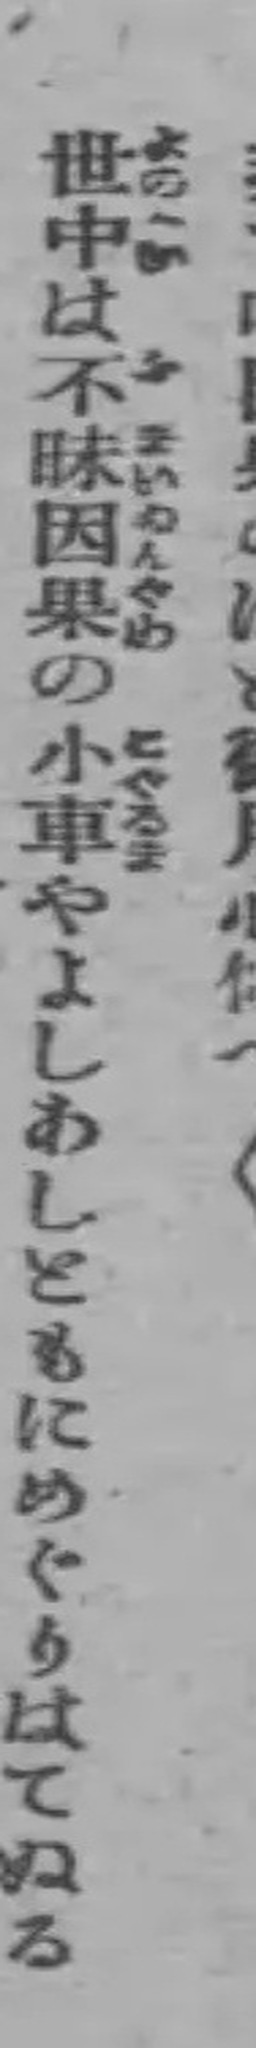世中は不昧因果の小車やよしあしともにめぐりはてぬる
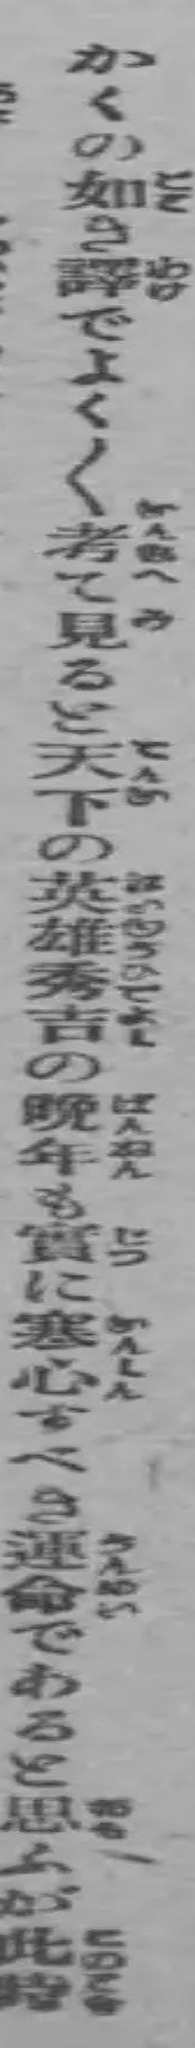かくの如き訳でよく〳〵考て見ると天下の英雄秀吉の晩年も実に寒心すべき運命であると思ふが此時
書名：豊橋市史談
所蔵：国立国会図書館 National Diet Library, JAPAN
